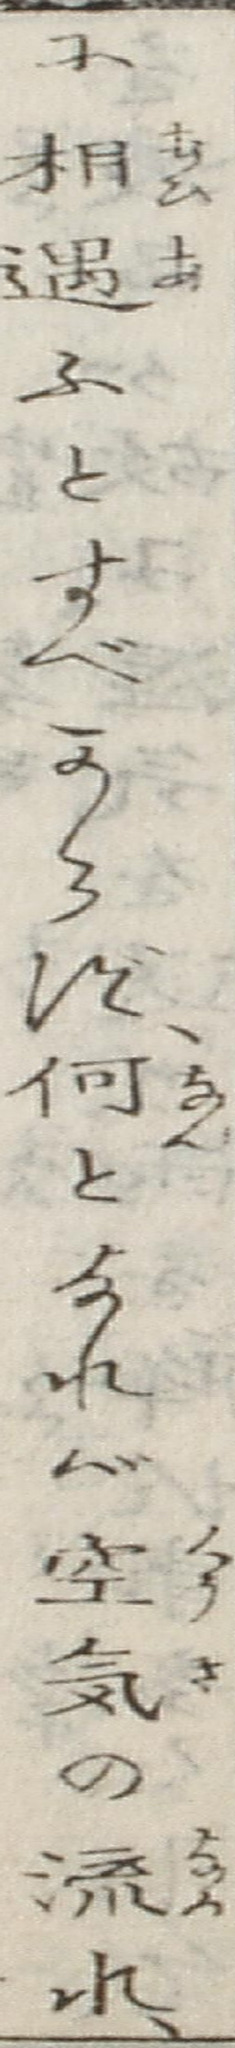に相遇ふとすべからず、何となれば空気の流れ、
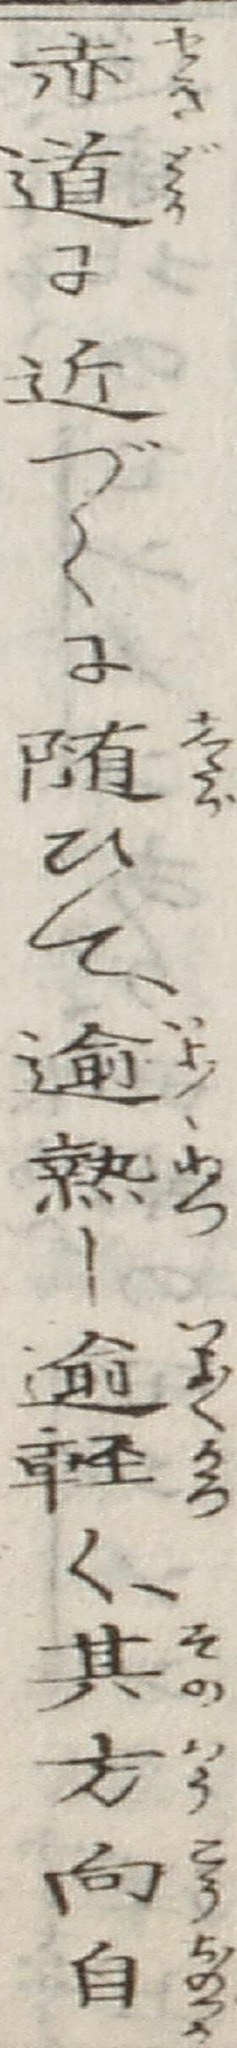赤道に近づくに随ひて、愈熱し愈軽く、其方向自
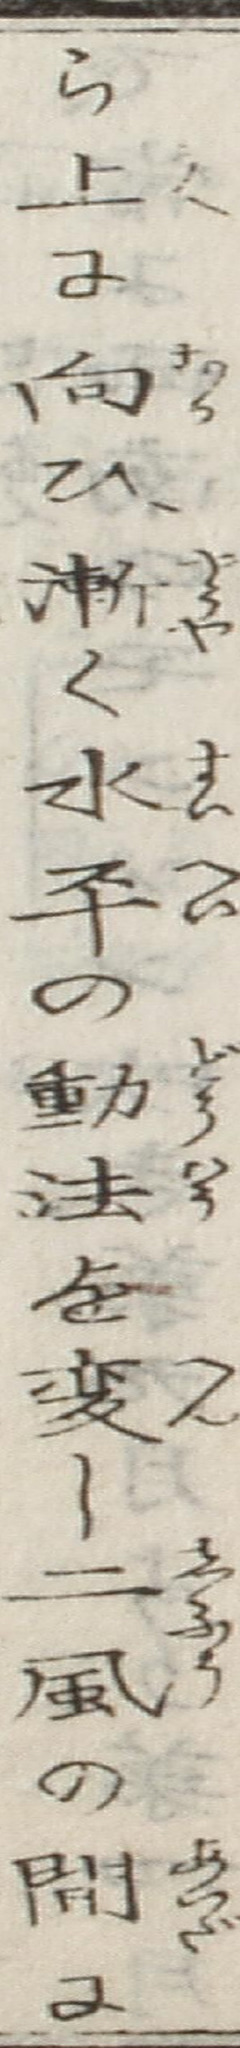ら上に向ひ、漸く水平の動法を変し二風の間に
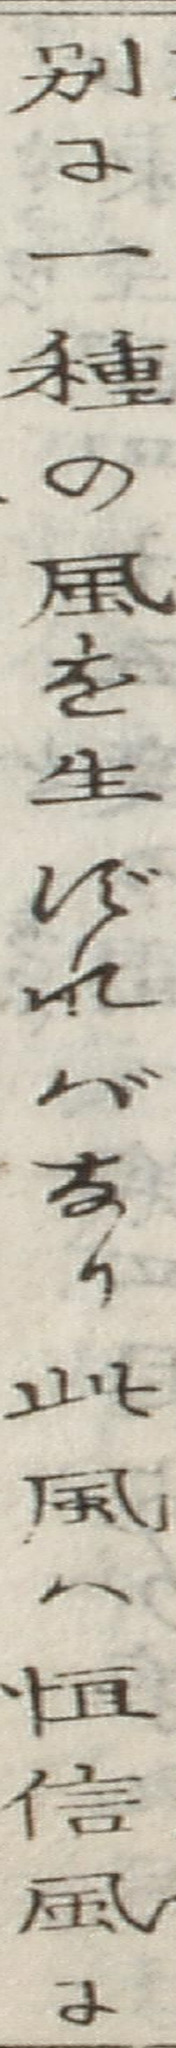別に一種の風を生ずればなり此風は恒信風に
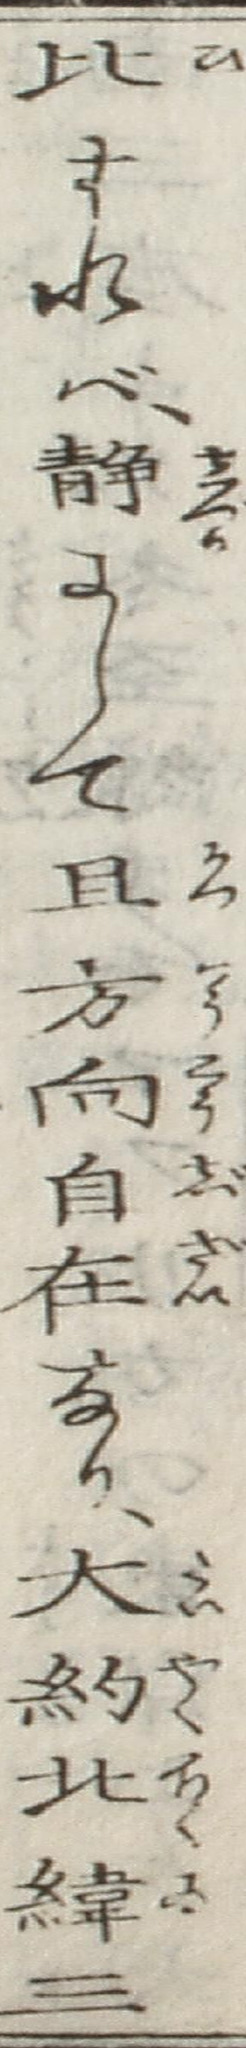比すれば、静にして且方向自在なり、大約北緯三
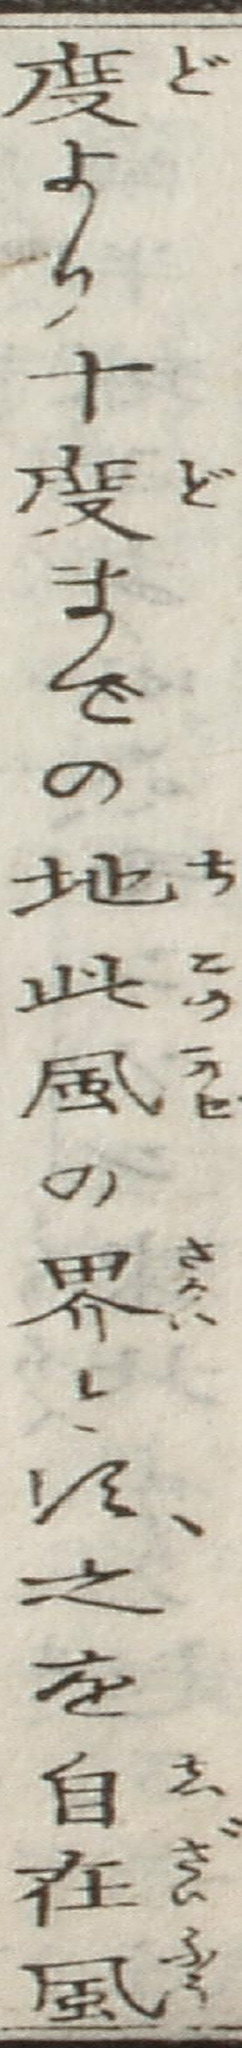度より十度までの地此風の界とす、之を自在風
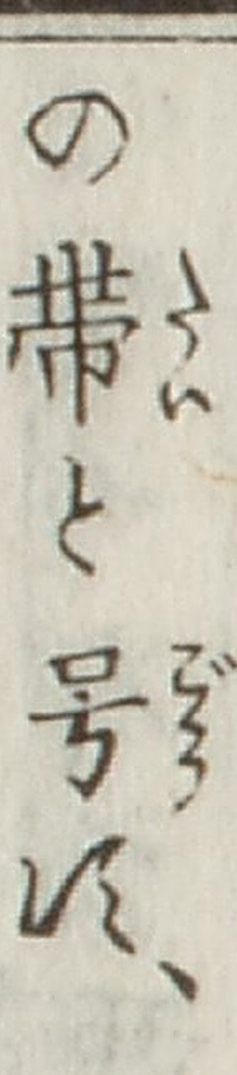の帯と号す、
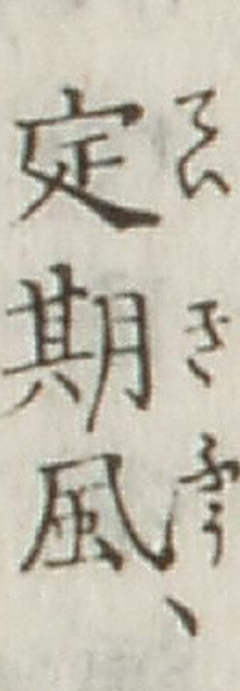定期風、
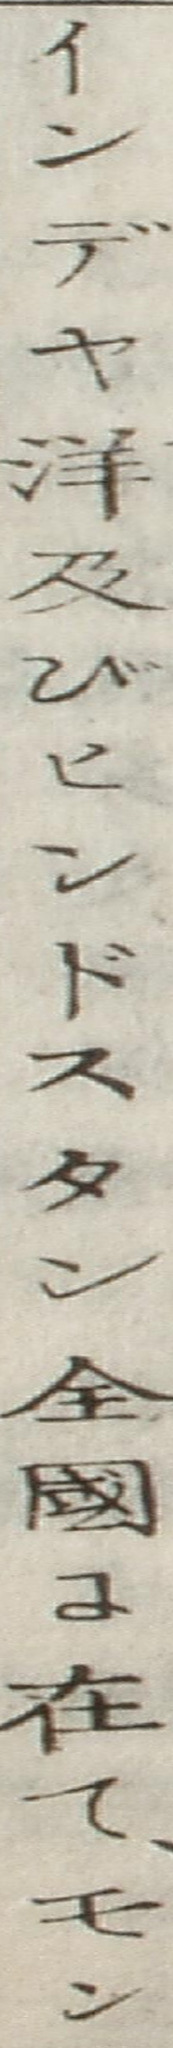インデヤ洋及びヒンドスタン全国に在てモン

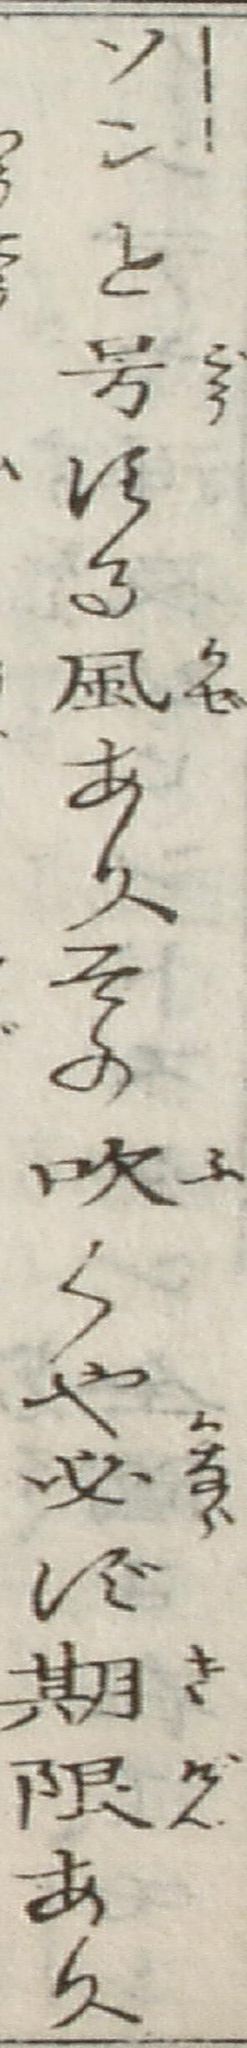ソンと号する風あり、その吹くや必ず期限あり、
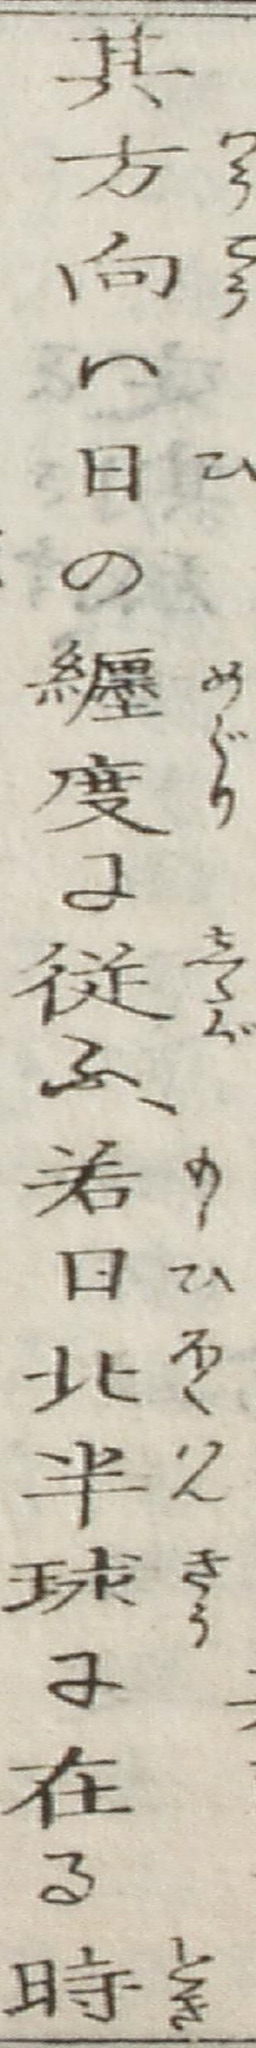其方向は日の纏度に従ふ、若日北半球に在る時
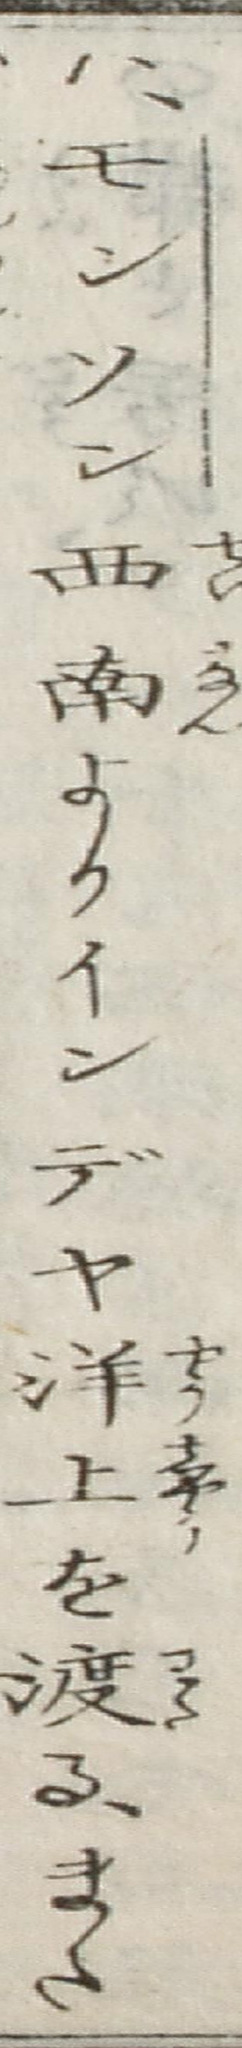は、モンソン西南よりインデヤ洋上を渡る、また
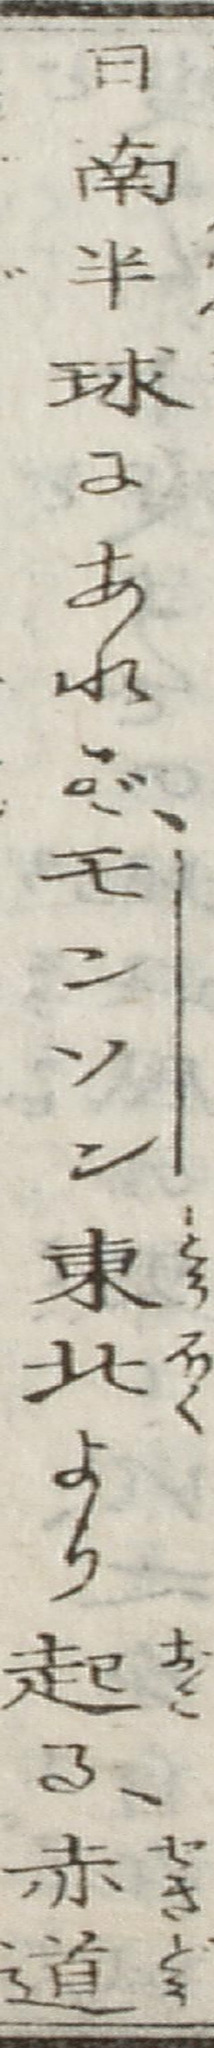日南半球にあれば、モンソン東北より起る、赤道
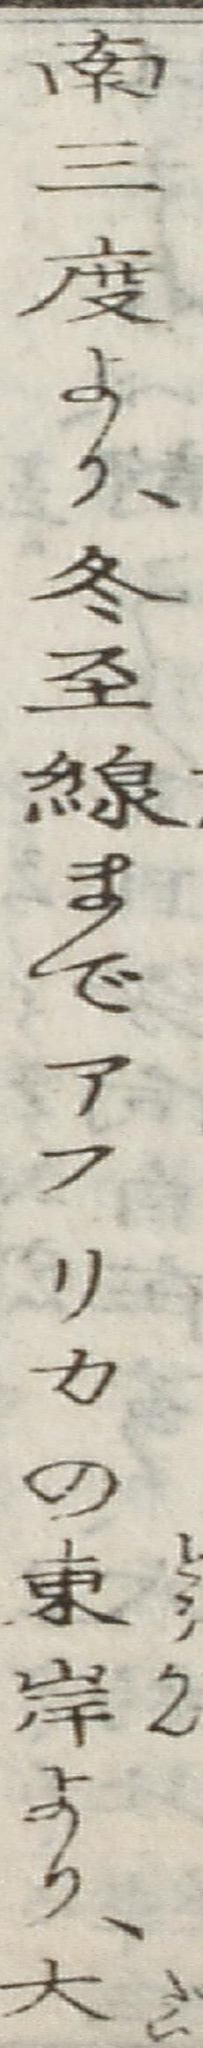南三度より、冬至線までアフリカの東岸より、大
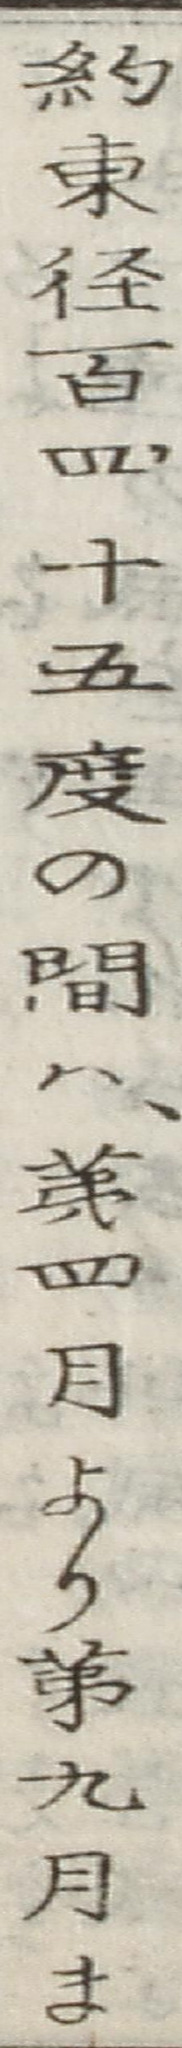約東経百四十五度の間は、第四月より第九月ま
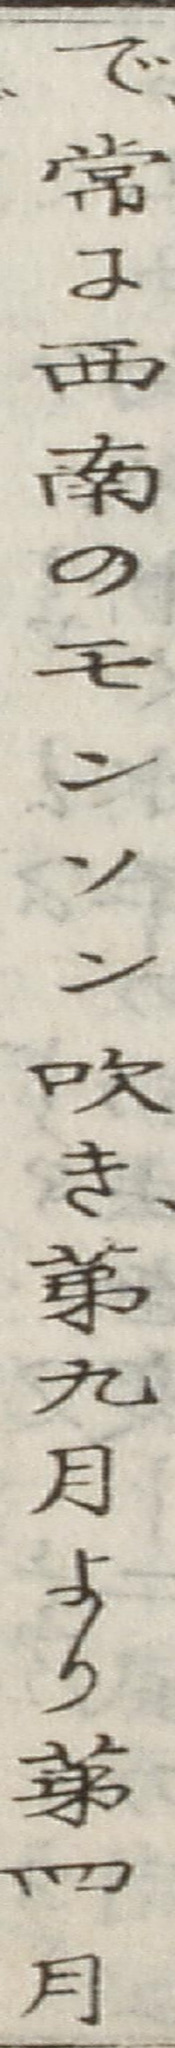で、常に西南のモンソン吹き、第九月より第四月
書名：訓蒙　天然地理學　中
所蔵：東京大学地震研究所図書室 Earthquake Research Institute Library, The University of Tokyo, JAPAN
